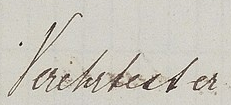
Verehrtester
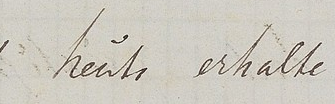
heute erhalte
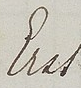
ich
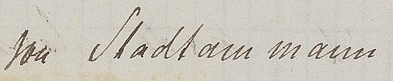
von Stadtammann Schmidlin,
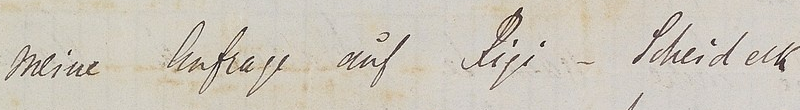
meine Anfrage auf Rigi-Scheideck
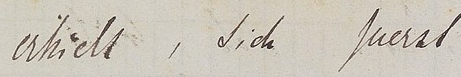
erhielt, sich zuerst
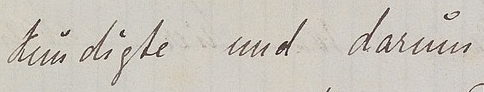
kundigte und darum
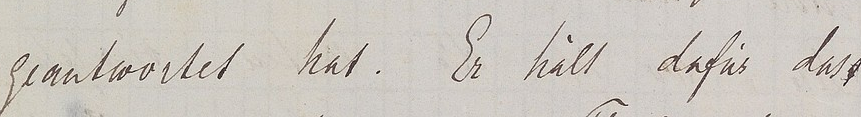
geantwortet hat. Er hält dafür dass
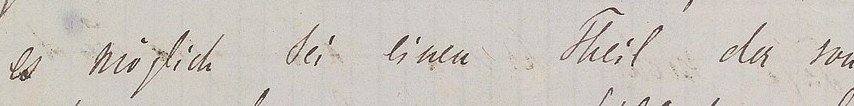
es möglich sei einen Theil der von
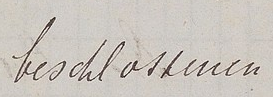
beschlossenen
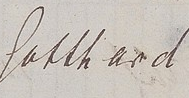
Gotthard
